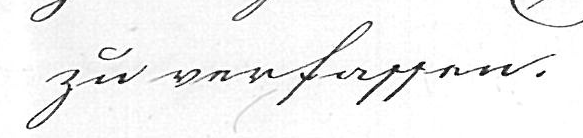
zur verfassen.
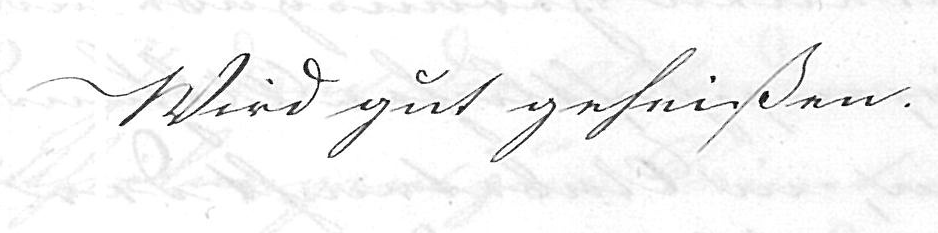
Wird gut geheißen.
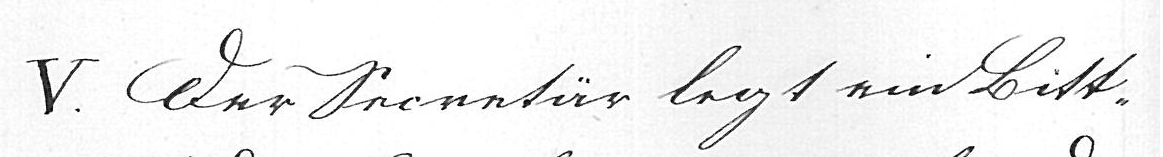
V. Der Secretär legt ein Bitt-
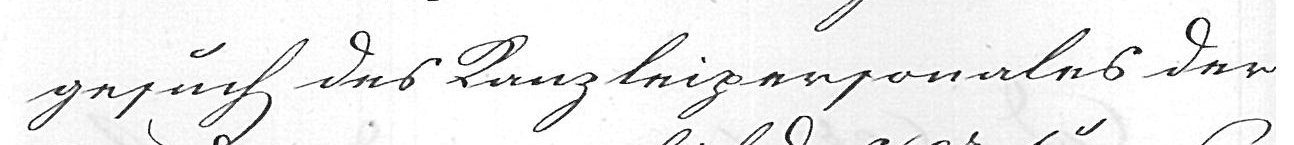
gesuch das Kanzleipersonales der
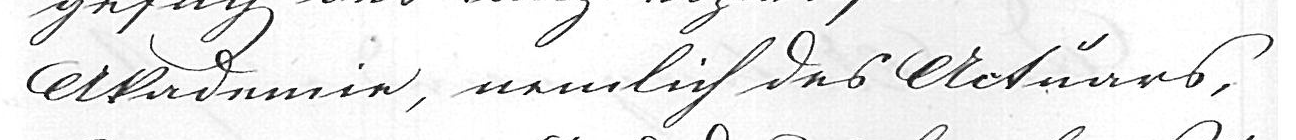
Akademie, nemlich des Actuars,
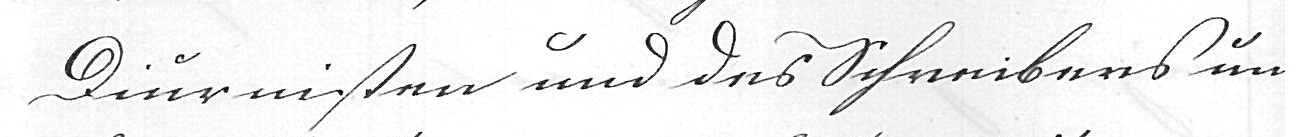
Diurnisten und des Schreibers um
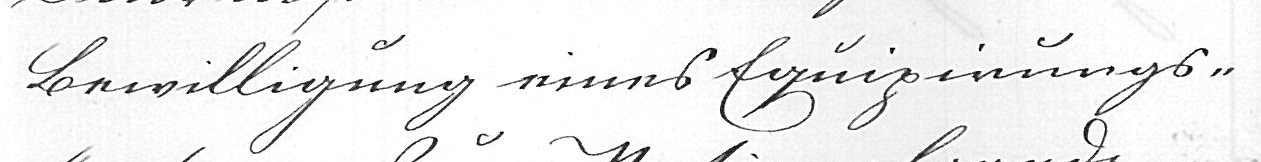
Bewilligung eines Equipirungs-
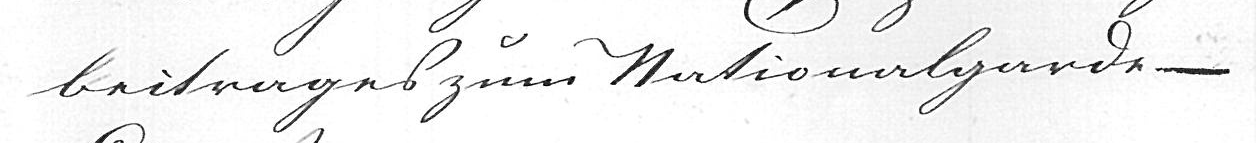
beitrages zum Nationalgarde-
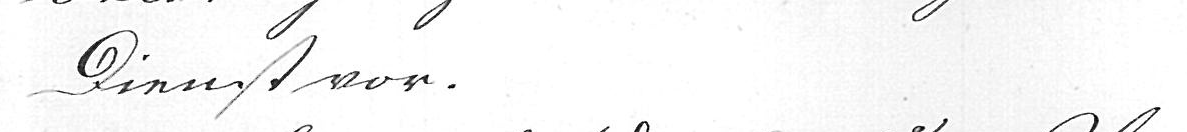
Dienst vor.
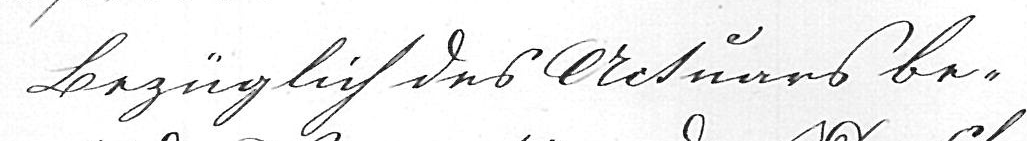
Bezüglich des Actuars be-
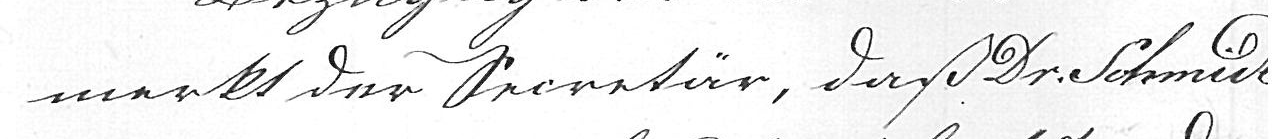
merkt der Secretär, daß Dr. Schmidl
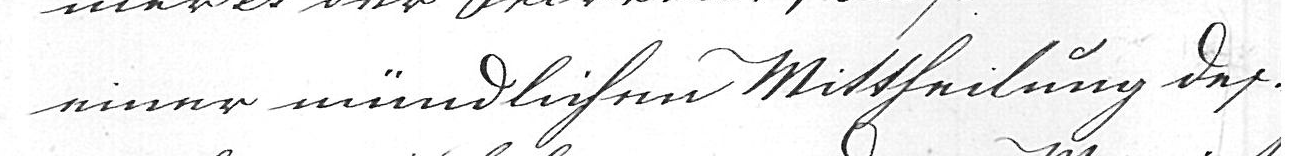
einer mündlichen Mittheilung des-
